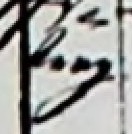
berg
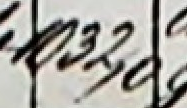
1032,0
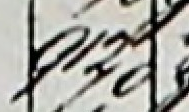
912,0
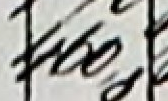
460,8
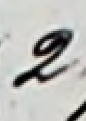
2
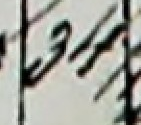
34
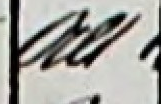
Alt
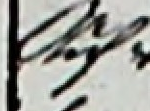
Aus„
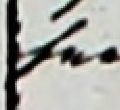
see
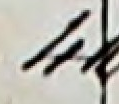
4
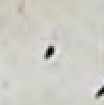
,
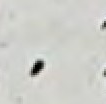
,
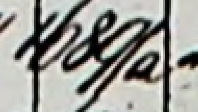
1689/a
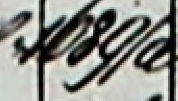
1689/a
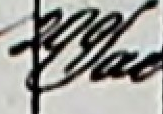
299/ac
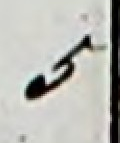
5
